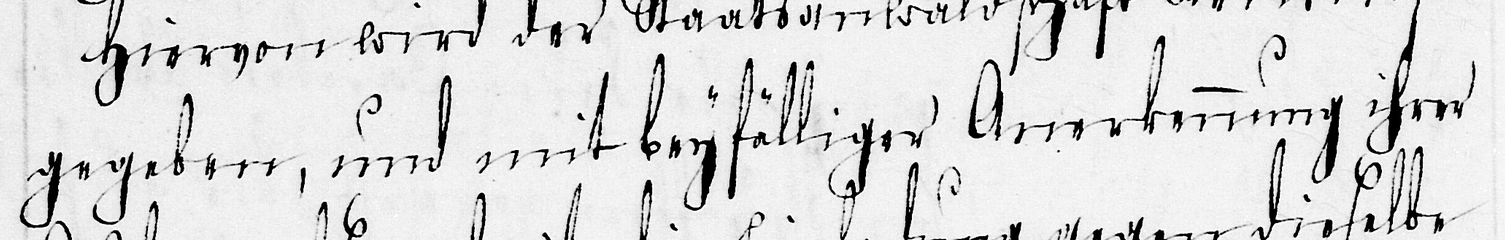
gegeben, und mit beyfälliger Anerkennung ihrer
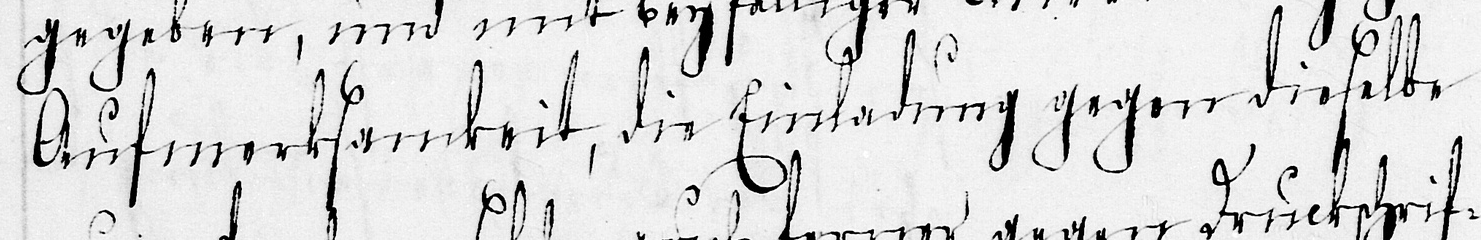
Aufmerksamkeit, die Einladung gegen dieselbe
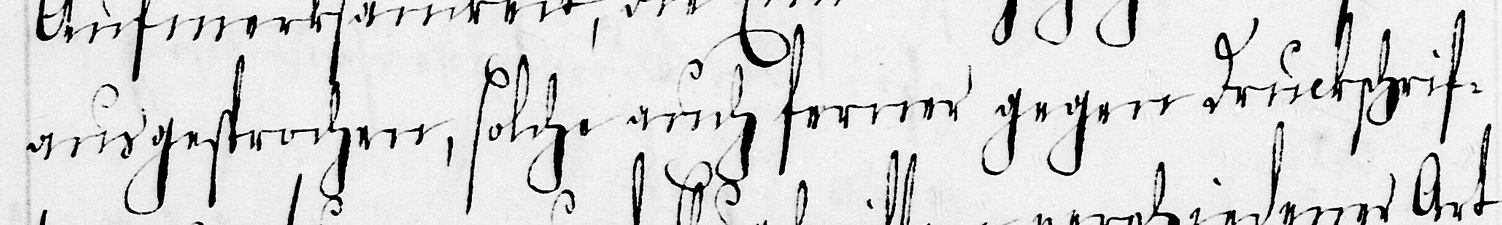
ausgesprochen, solche auch ferner gegen Druckschrif¬
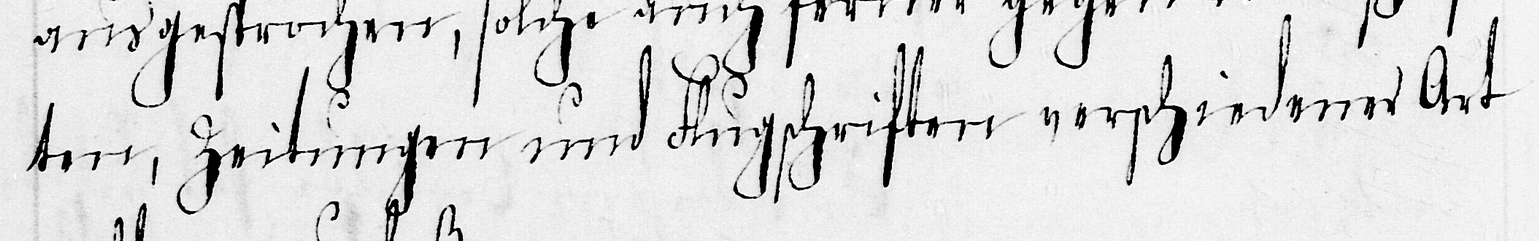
ten, Zeitungen und Flugschriften verschiedener Art
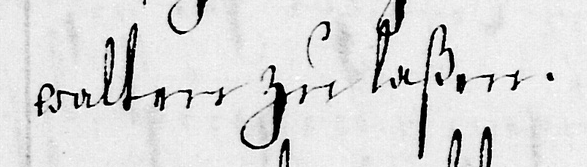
walten zu laßen.
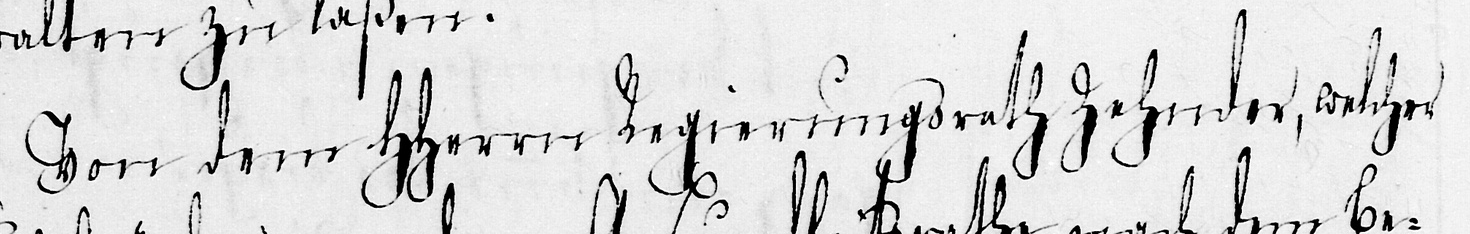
Von dem HHerrn Regierungsrath Zehnder, welcher
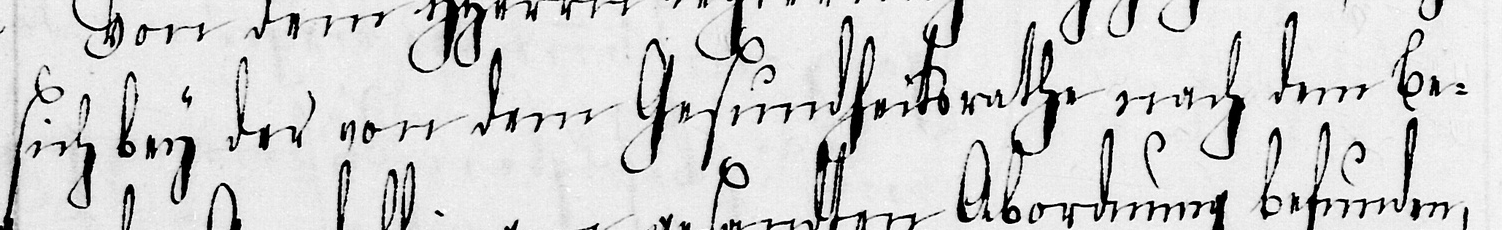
sich bey der von dem Gesundheitsrathe nach dem Be¬
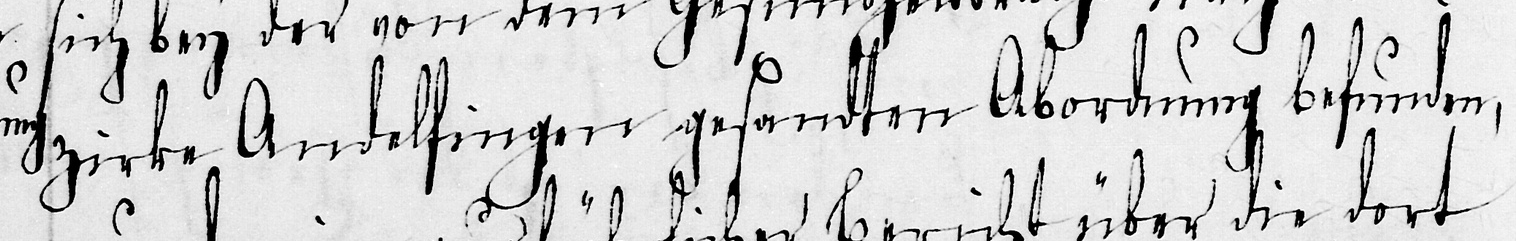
zirke Andelfingen gesandten Abordnung befunden,
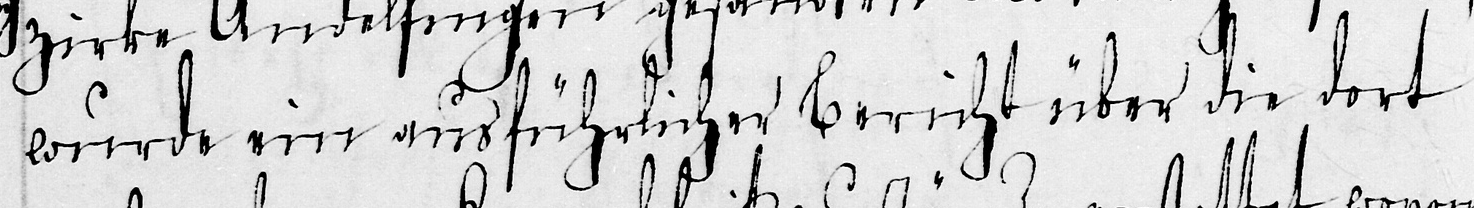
wurde ein ausführlicher Bericht über die dort
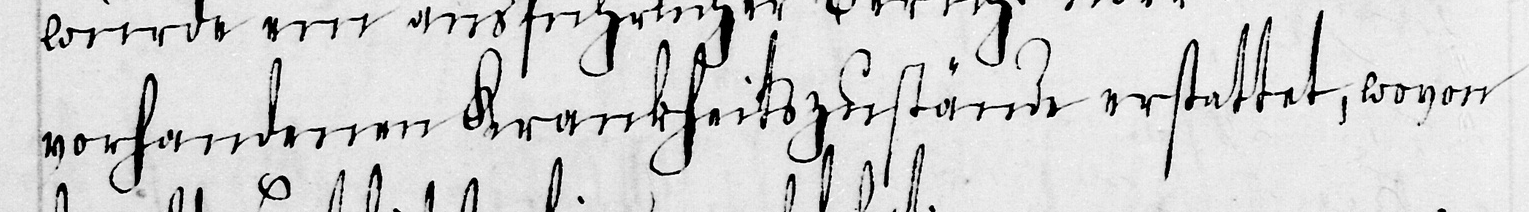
vorhandenen Krankheitszustände erstattet, wovon
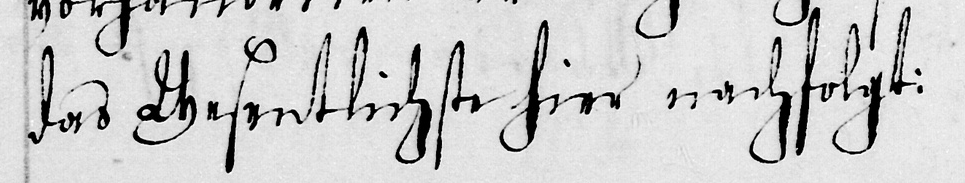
das Wesentlichste hier nachfolgt:
